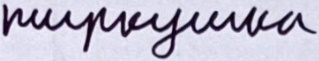тиркушка
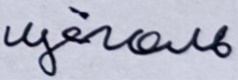щёголь
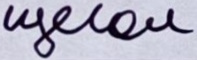щегол
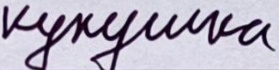кукушка
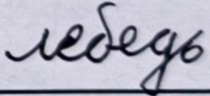лебедь
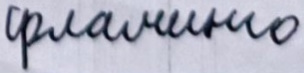фламинго
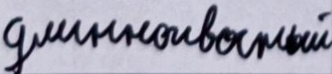длиннохвостый
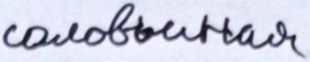соловьиная
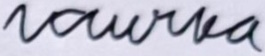гаичка
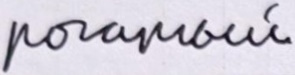рогатый
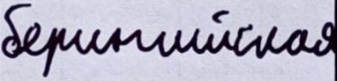берингийская
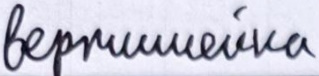вертишейка
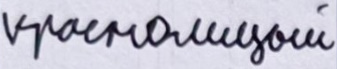краснолицый
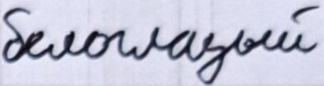белоглазый
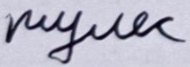тулес
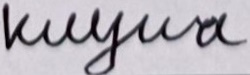клуша
